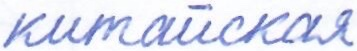китайская
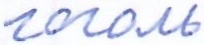гоголь
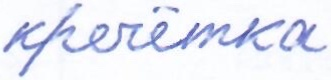кречётка
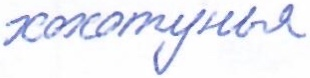хохотунья
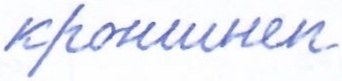кроншнеп
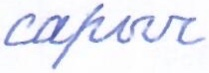сарыч
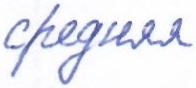средняя
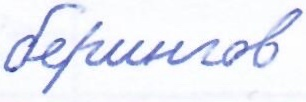берингов
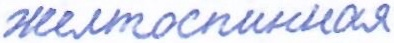желтоспинная
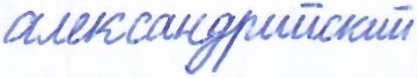александрийский
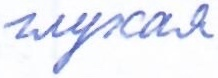глухая
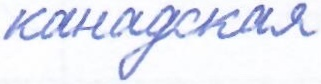канадская
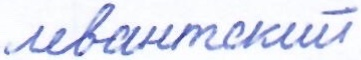левантский
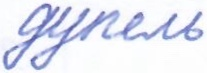дупель
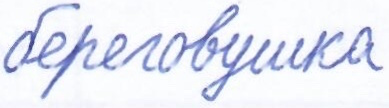береговушка
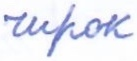чирок
